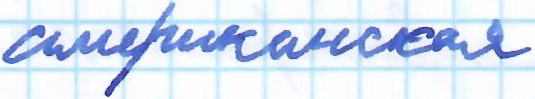американская
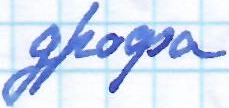дрофа
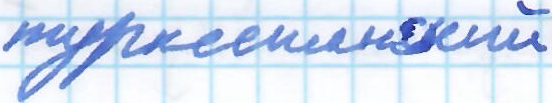туркестанский
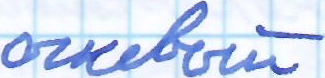очковый
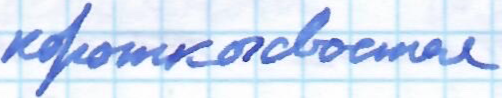короткохвостая
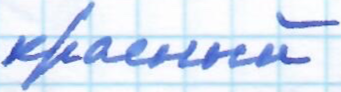красный
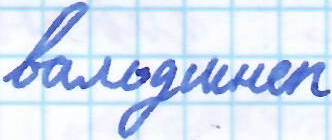вальдшнеп
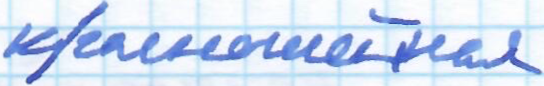красношейная
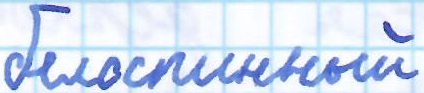белоспинный
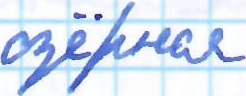озёрная
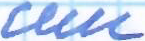сип
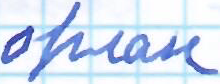орлан
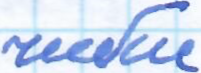чибис
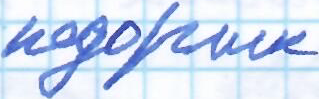подорлик
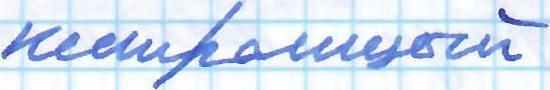пестролицый
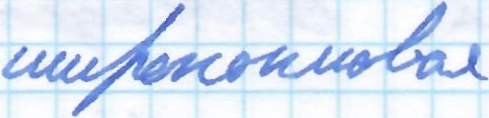ширококлювая
